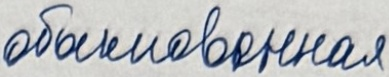обыкновенная
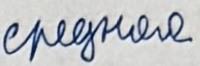средняя
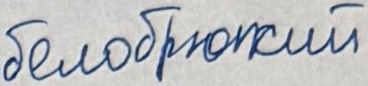белобрюхий
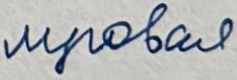луговая
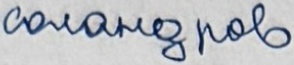соландров
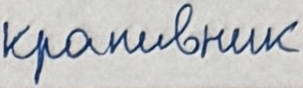крапивник
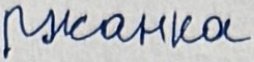ржанка
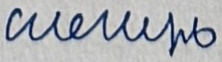снегирь
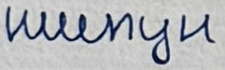шипун
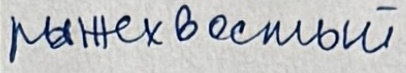рыжехвостый
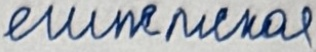египетская
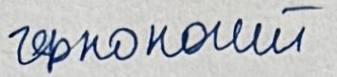черноногий
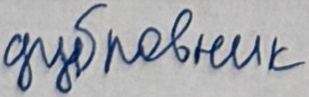дубпевник
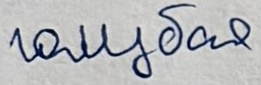голубая
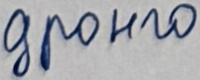дронго
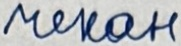чекан
